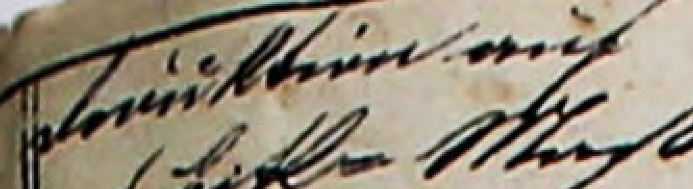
Funcktion auf
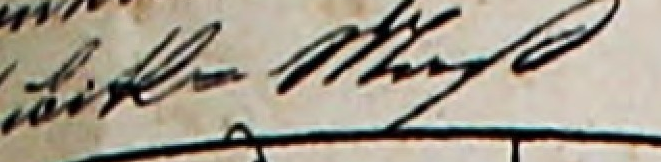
Cubika Maß
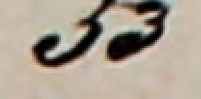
53
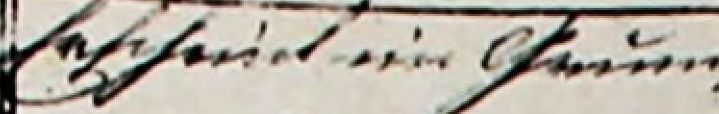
Ertsch??? im Grund„
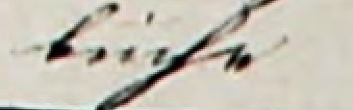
buche
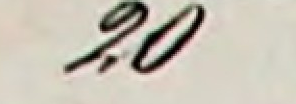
20
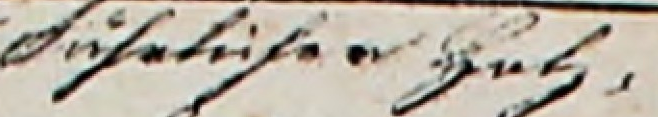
Fuhrleiter Holz„
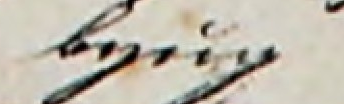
bezug
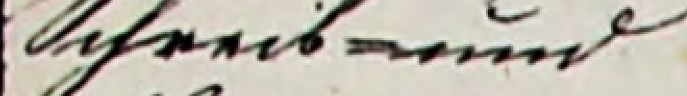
Schreib- und
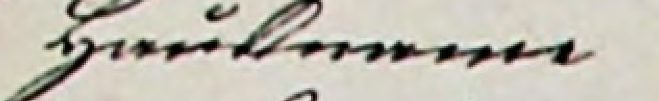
Hausname
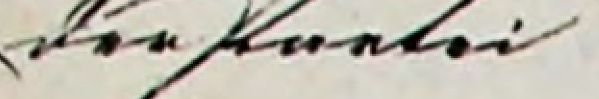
der Partei
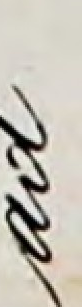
ad
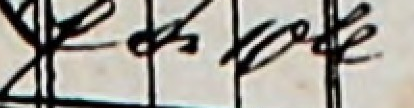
P Fr 10ll
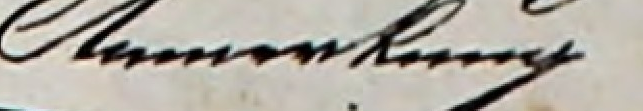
Anmerkung
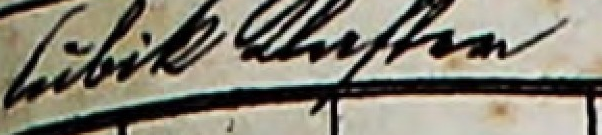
Cubik Klaster
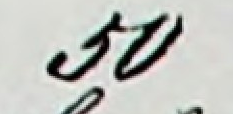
50
